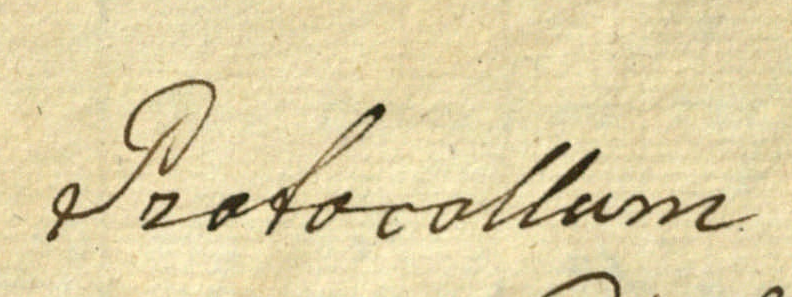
Protocollum
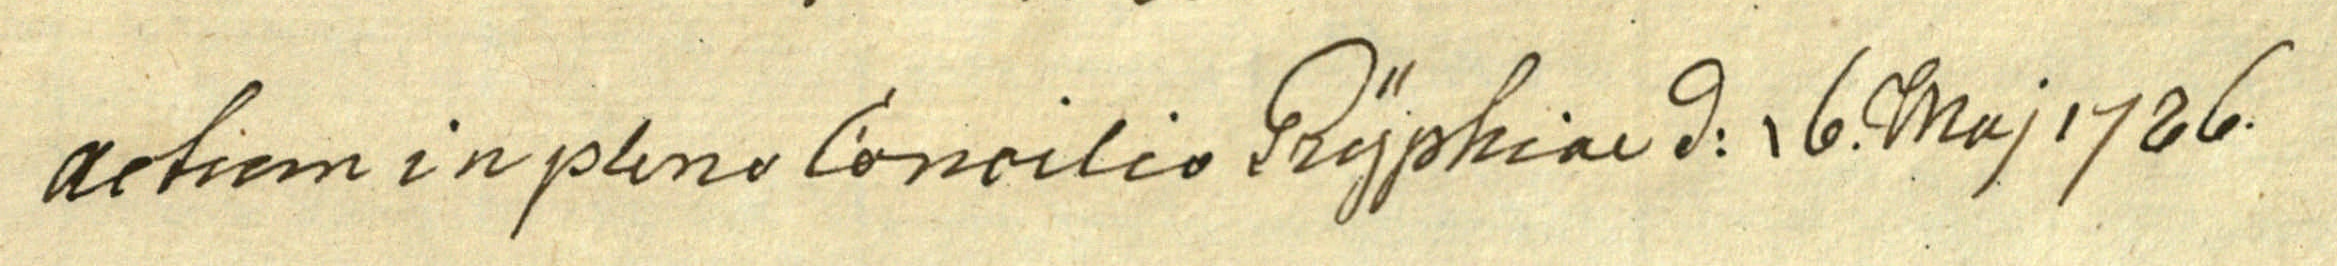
Actum in pleno Concilio Grÿphiae d. 6. Maj 1786
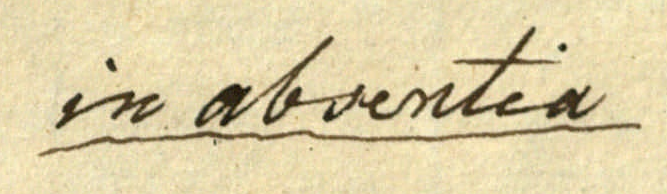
in absentia
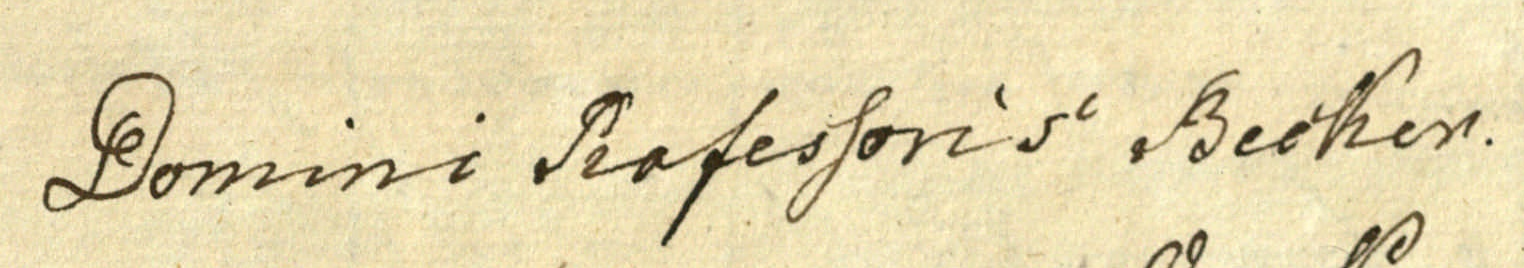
Domini Professoris Becker.
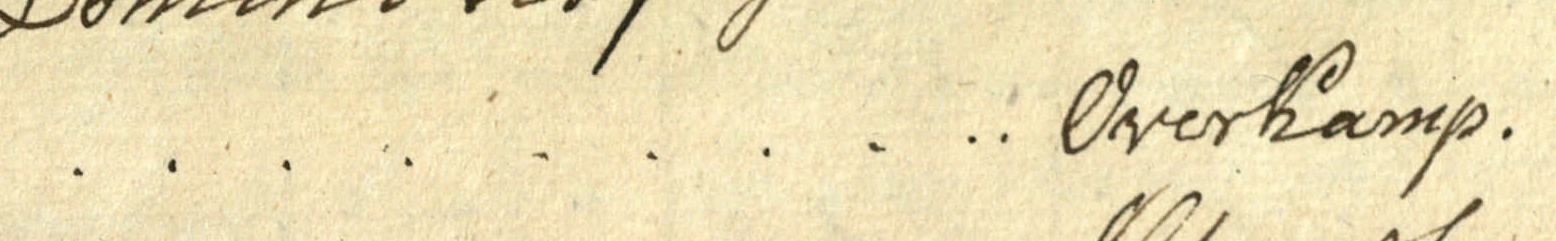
Overkamp.
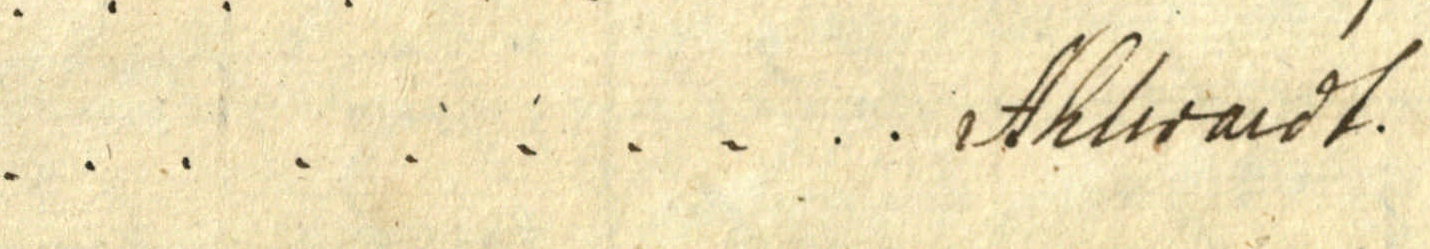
Ahlwardt.
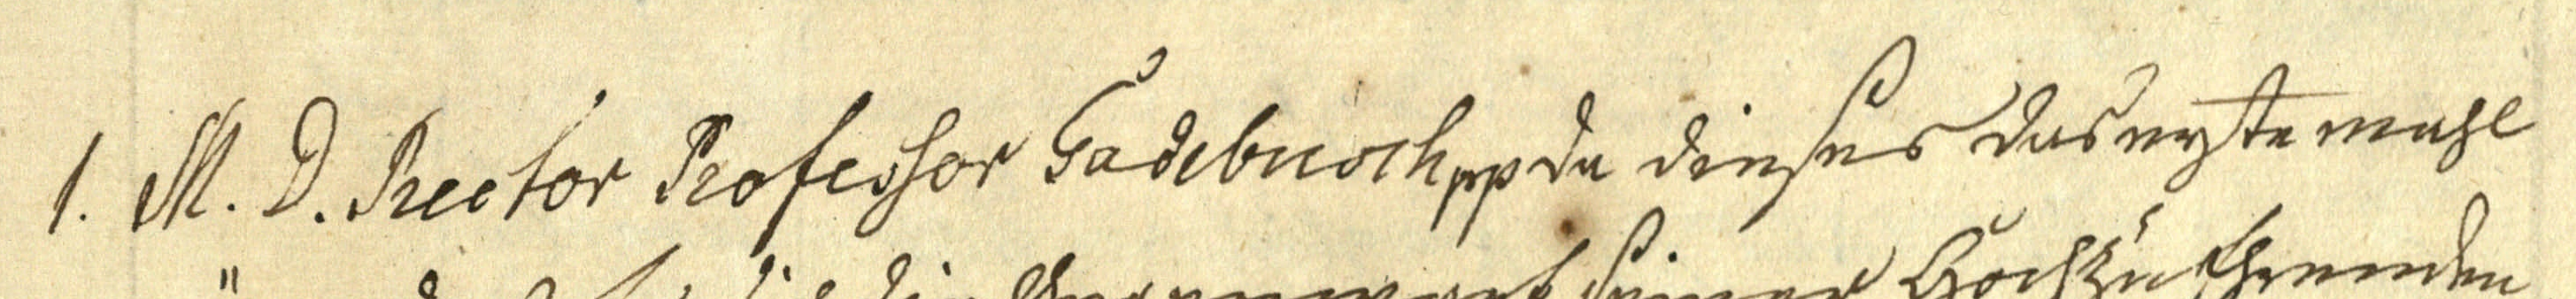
1. M. D. Rector Professor Gadebusch pp da dieses das erste mahl
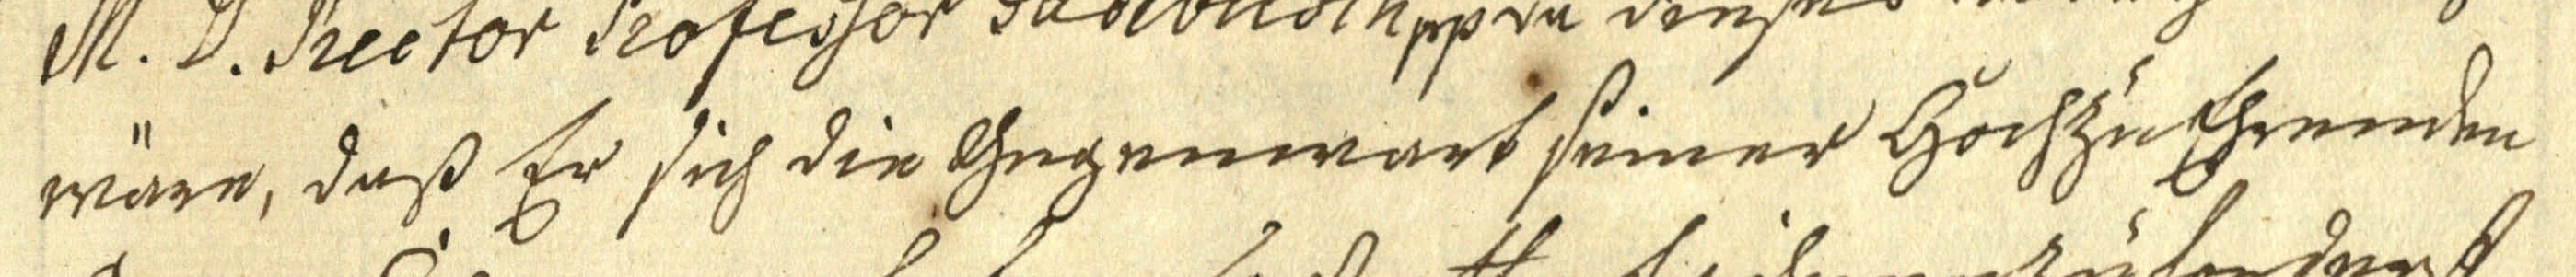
wäre, daß Er sich die Gegenwart seiner HochzuEhrenden
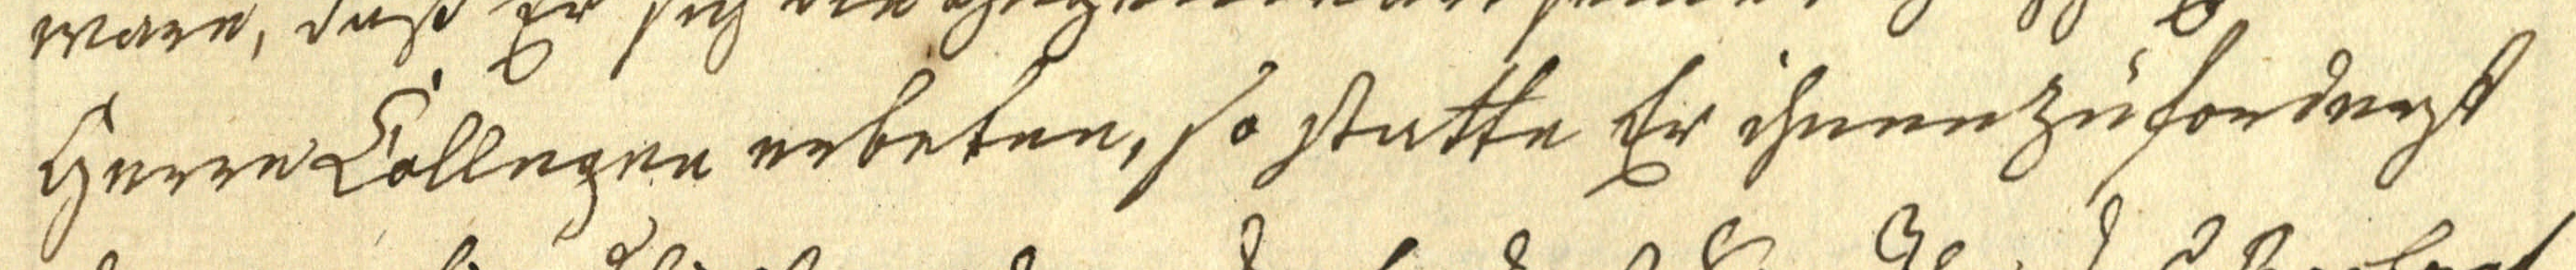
Herrn Collegen erbeten, so statte Er ihnen zuforderst
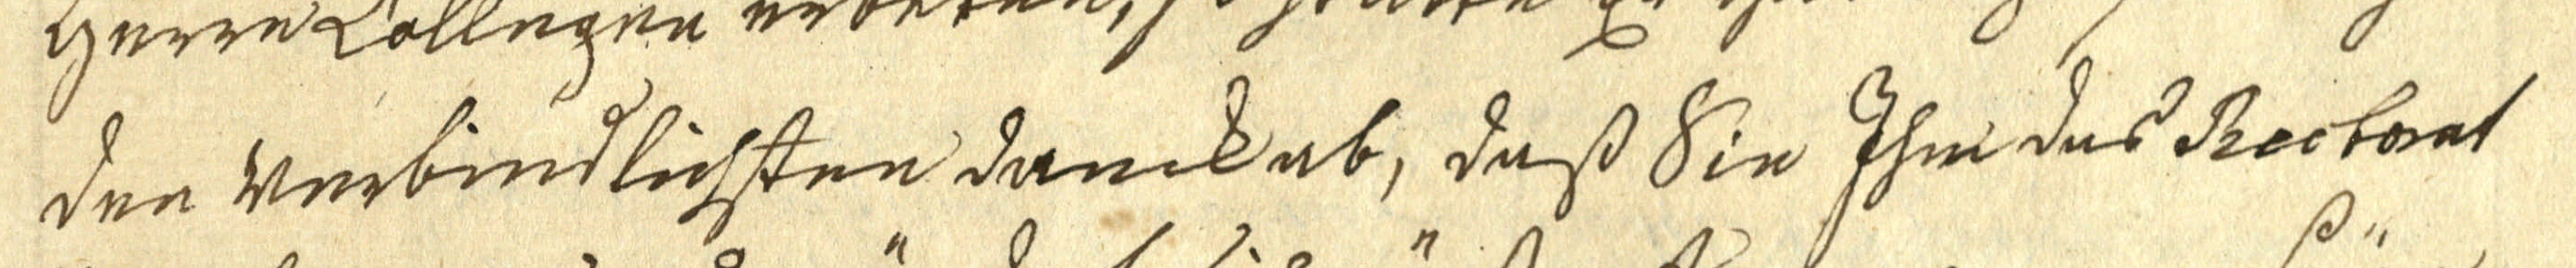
den verbindlichsten Danck ab, daß Sie Ihm das Rectorat
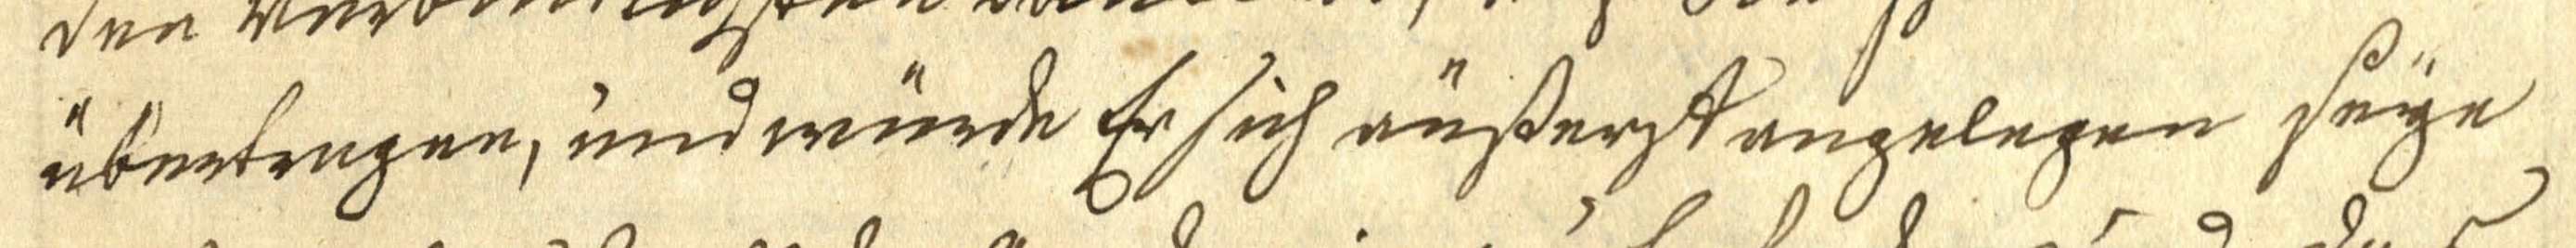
übertragen, und würde Er sich äußerst angelegen seÿn
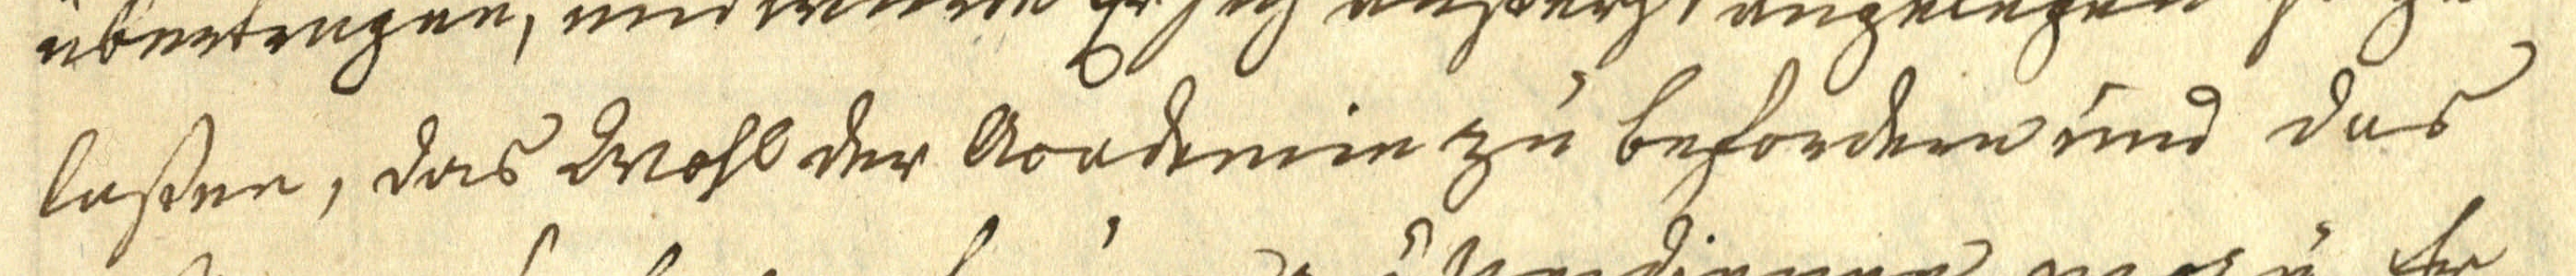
laßen, das Wohl der Academie zu befordern und das
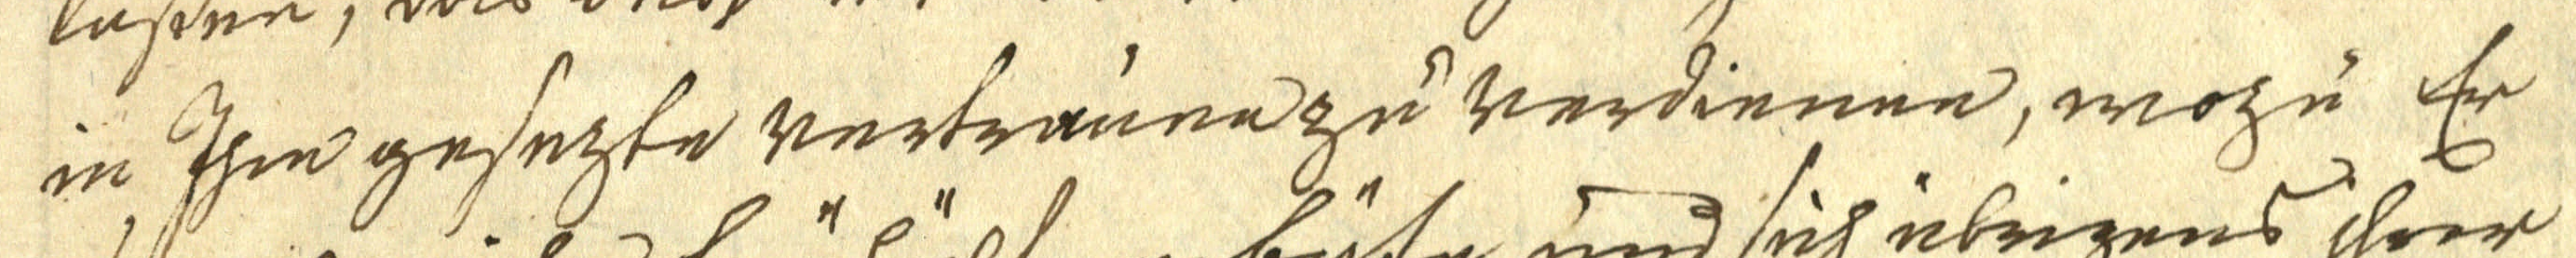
in Ihm gesezte Vertrauen zu verdienen, wozu Er
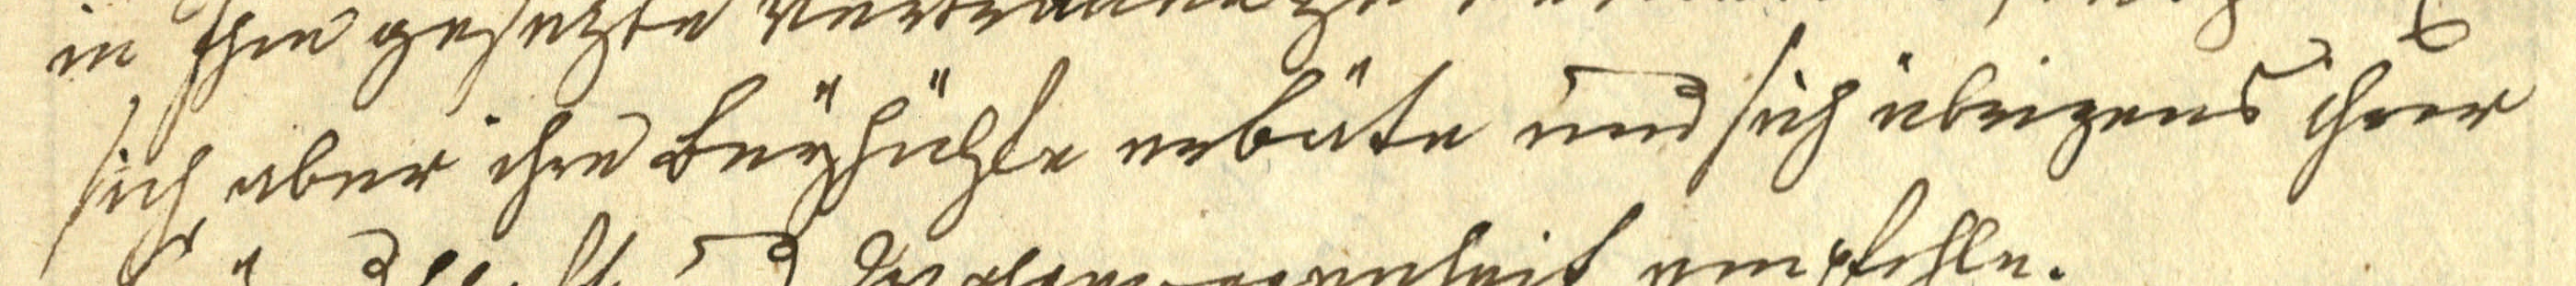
sich aber ihre Beÿhülfe erbäte und sich übrigens ihrer
